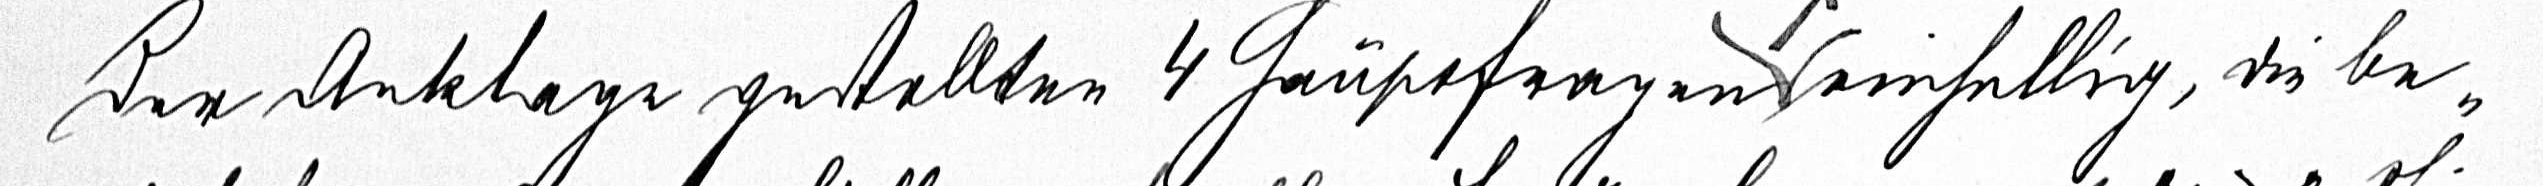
der Anklage gestellten 4 Hauptfragen einhellig, die be¬
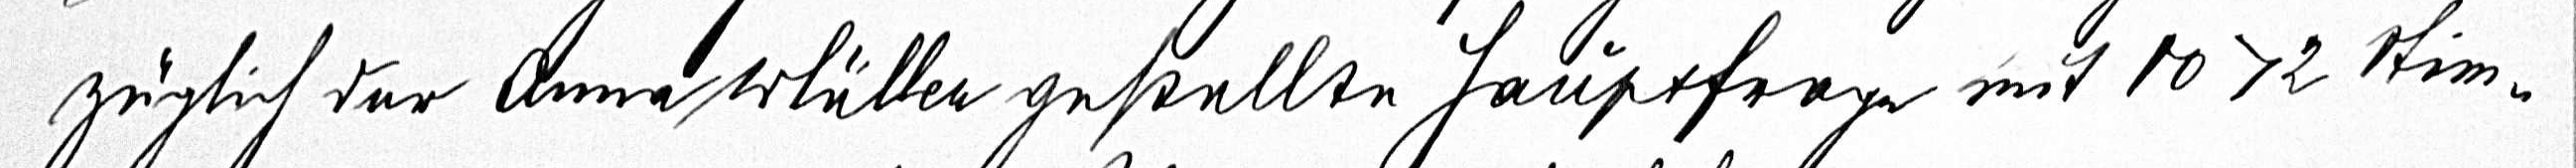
züglich der Anna Müller gestellten Hauptfrage mit 10>3 Stim¬
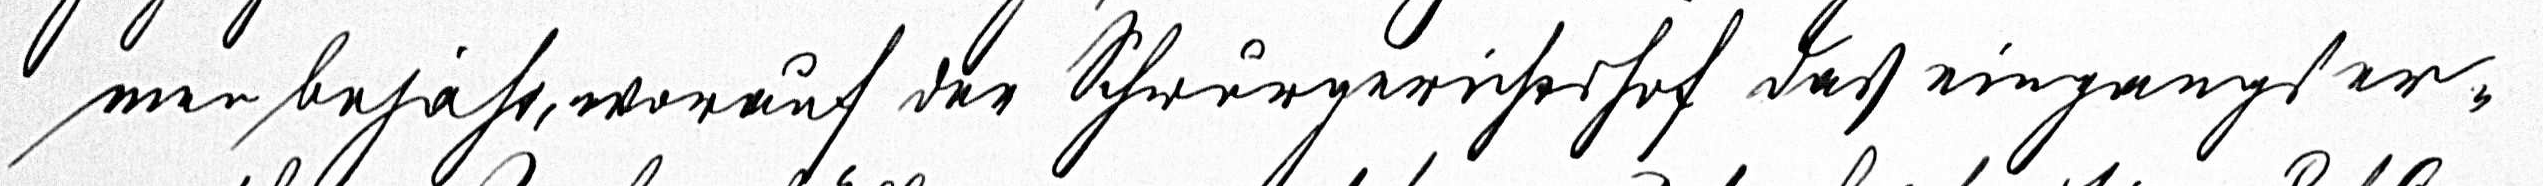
men bejaht, worauf der Schwurgerichtshof des eingangs er¬
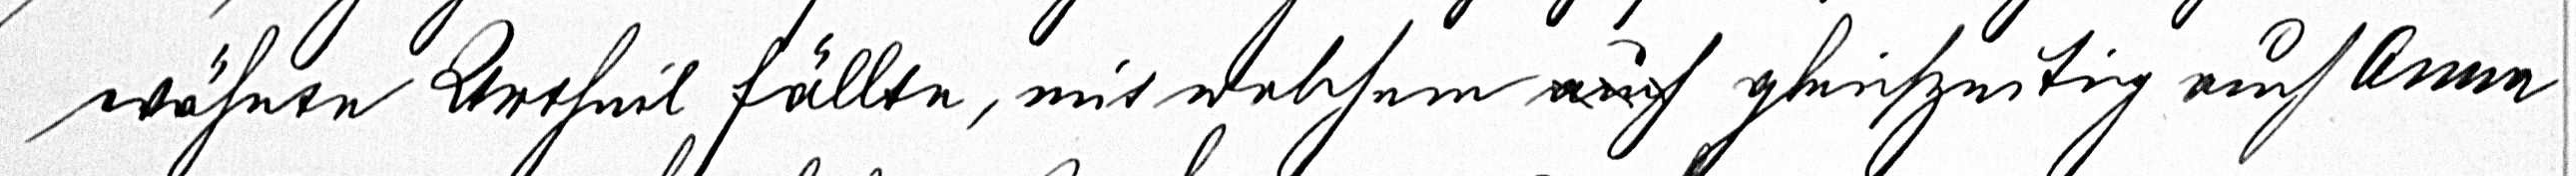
wähnten Urtheil fällte, mit welchem gleichzeitig auch Anna
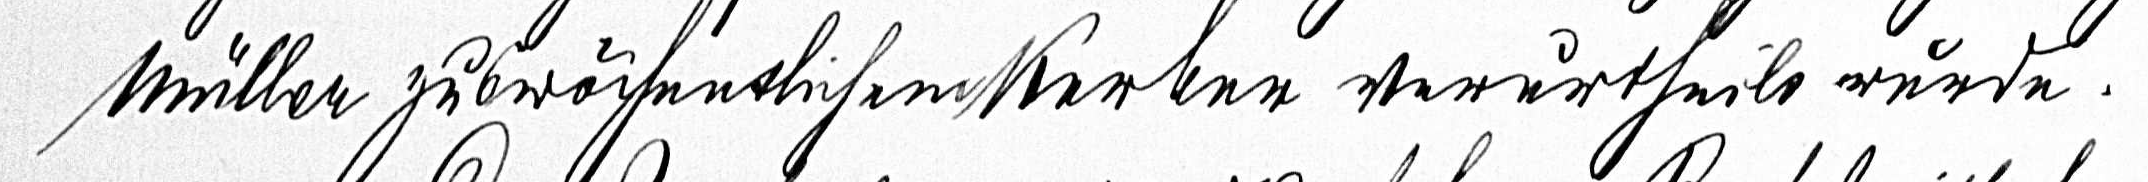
Müller zu 6wöchentlichen Kerker verurtheilt wurde.
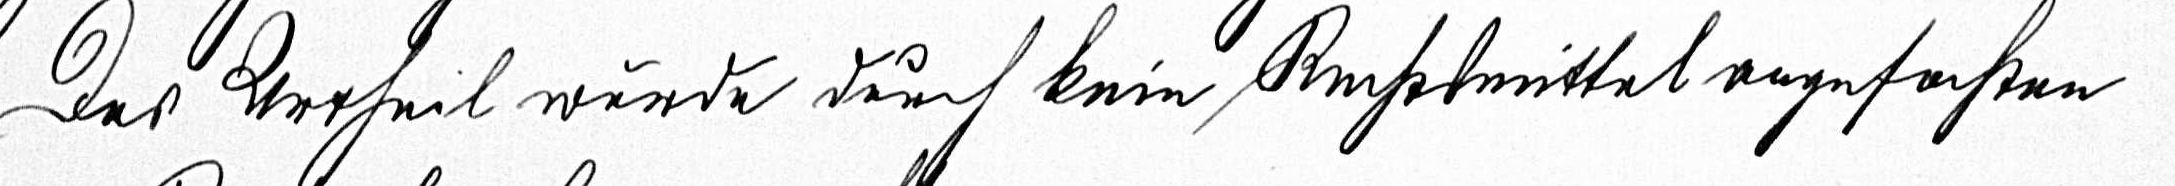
Der Urtheil wurde durch kein Rechtmittel angefochten
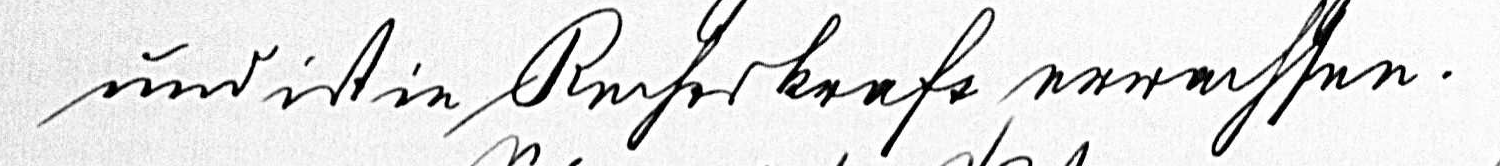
und ist in Rechtskraft erwachsen.
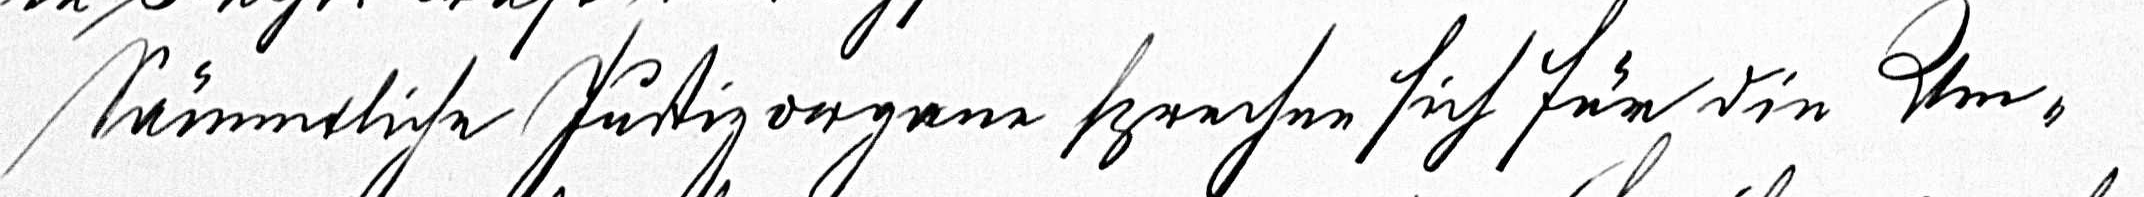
Sämmtliche Justizorgane sprechen sich für die Um¬
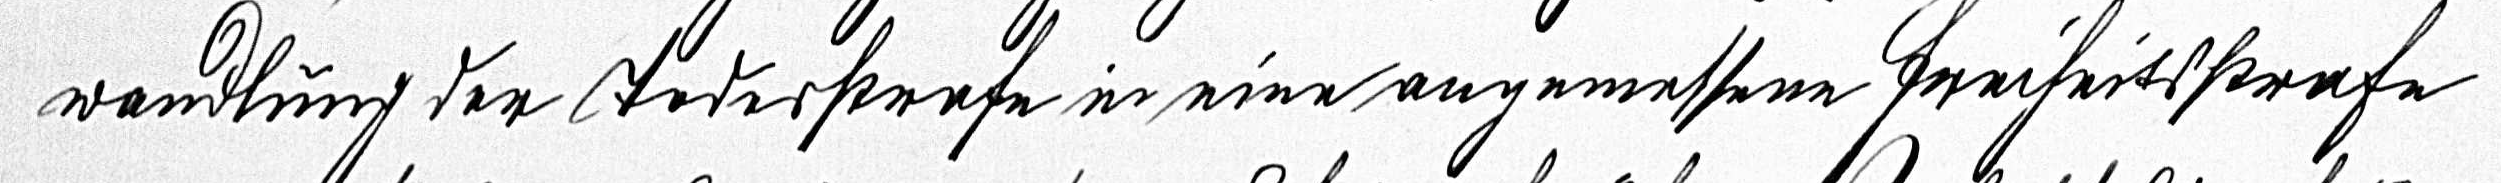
wandlung der Todesstrafe in eine angemessene Freiheitsstrafe
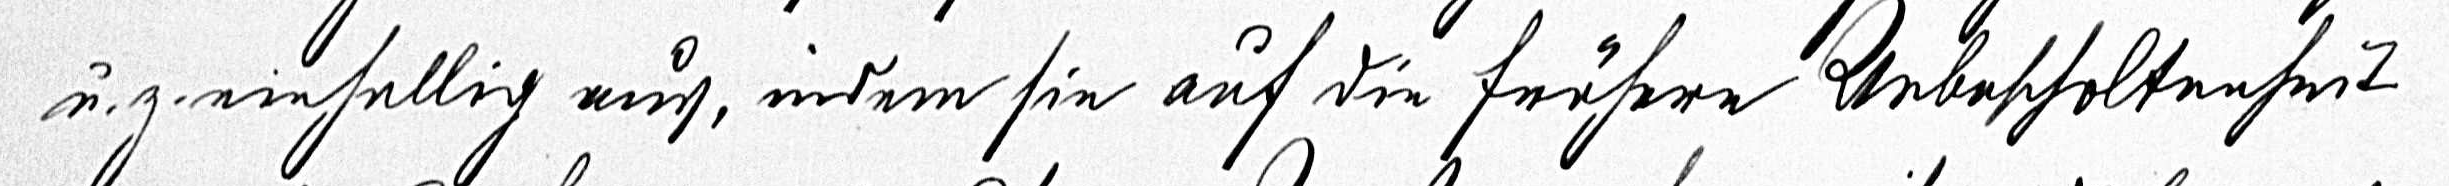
u.z. einhellig aus, indem sie auf die frühere Unbescholtenheit
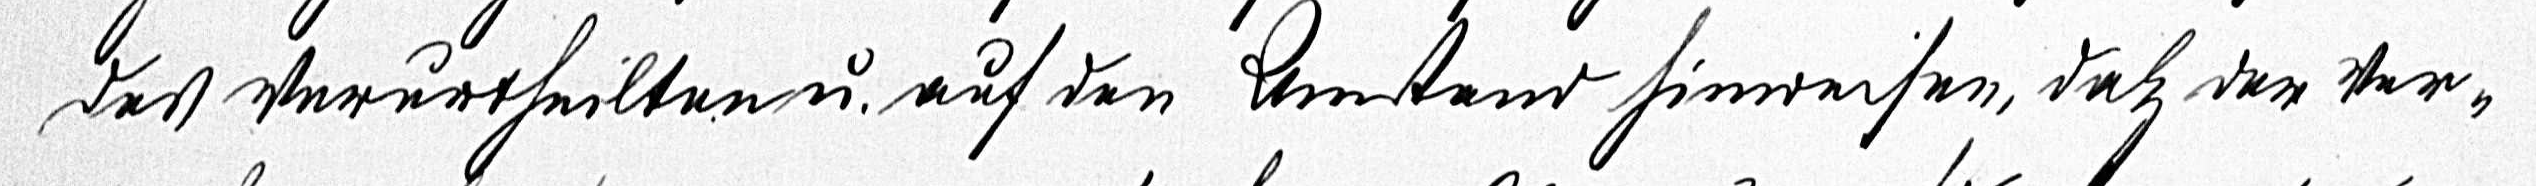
des Verurtheilten u. auf den Umstand hinweisen, daß der Ver¬
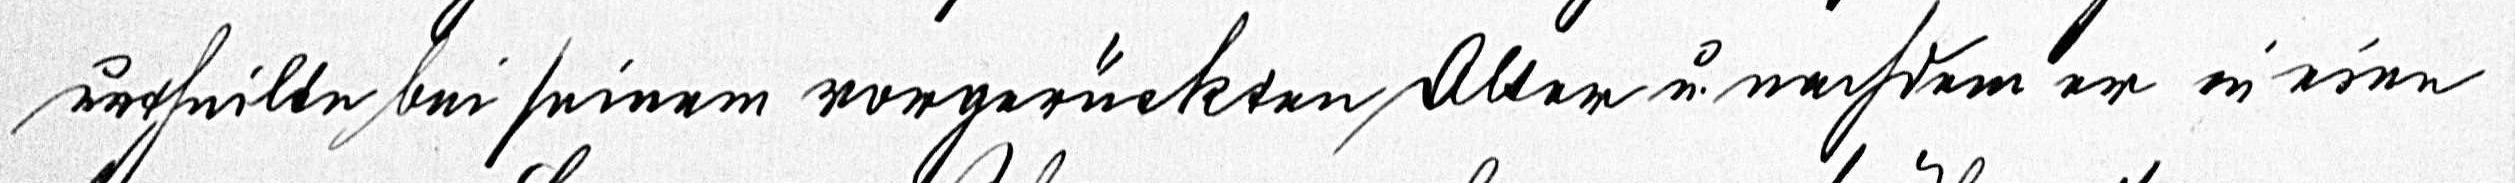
urtheilte bei seinem vorgerückten Alter u. nachdem er in eine
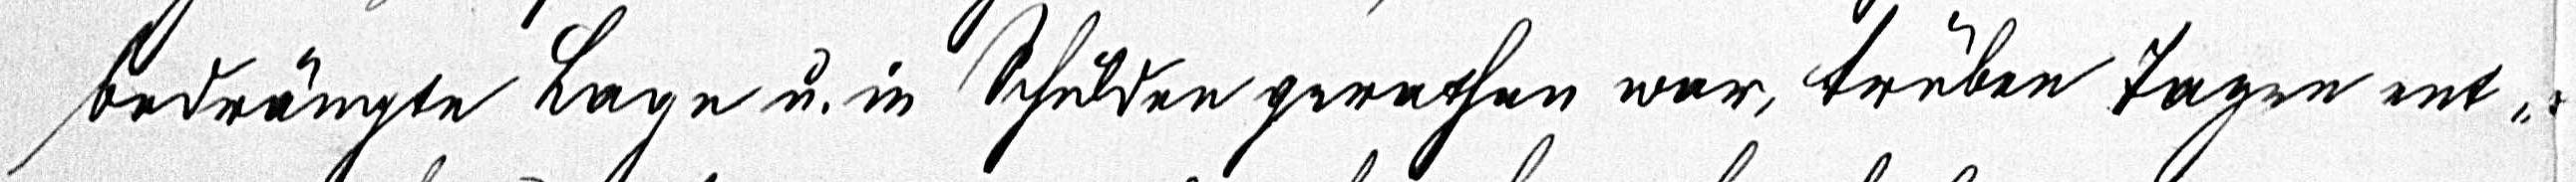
bedrängte Lage u. in Schulden gerathen war, trüben Tagen ent¬
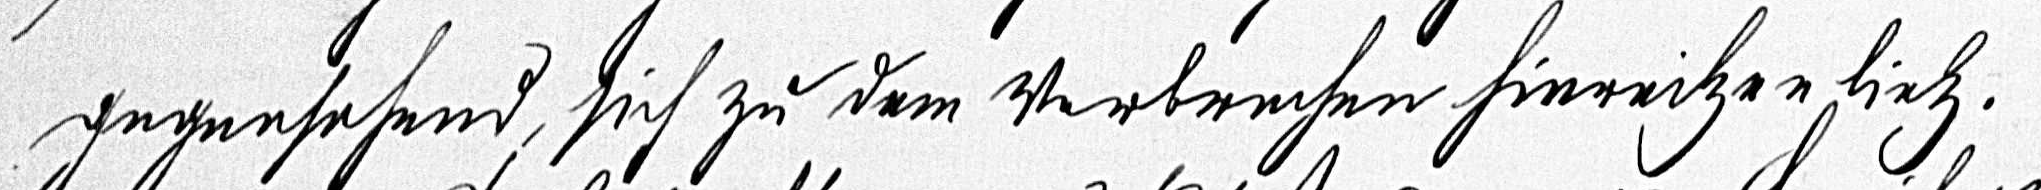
gegensehend, sich zu dem Verbrechen hinreißen ließ.
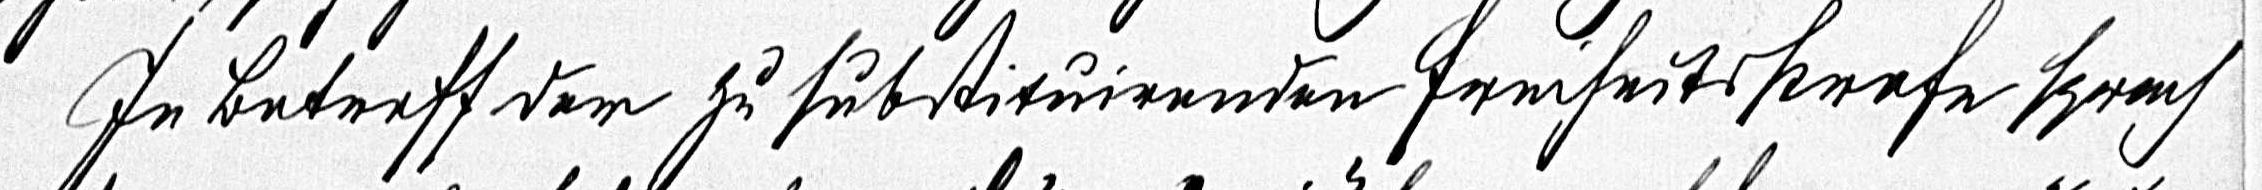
In Betreff der zu substituirenden Freiheitstrafe sprach
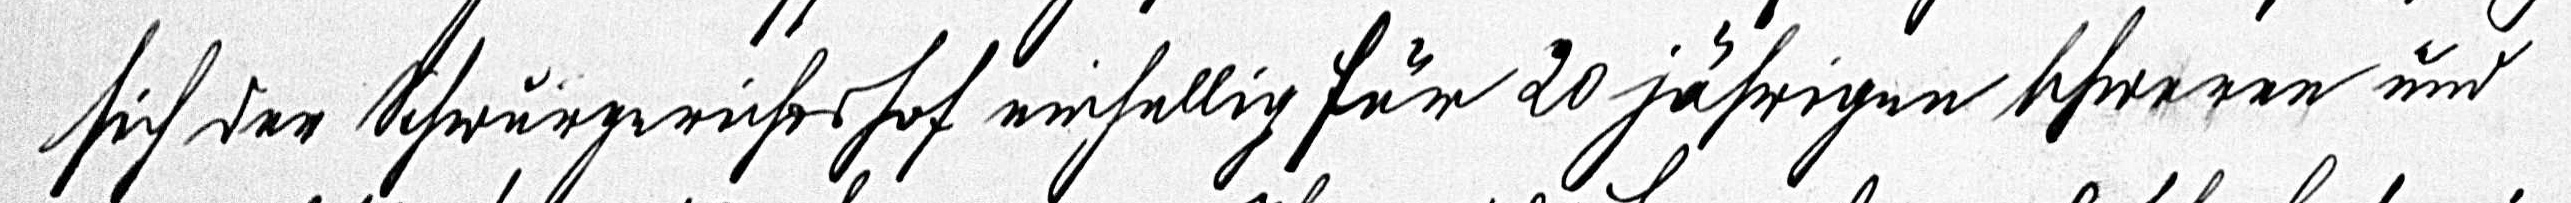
sich der Schwurgerichtshof einhellig für 20 jährigen schweren und
